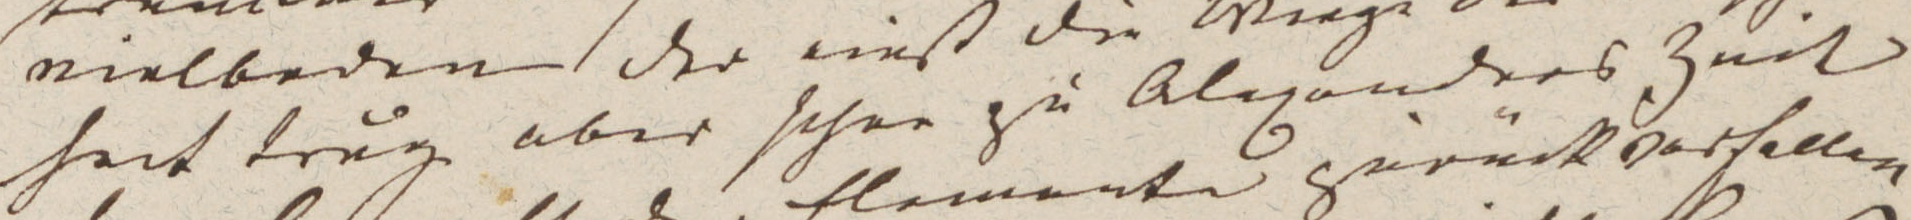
heit trug aber schon zu Alexanders Zeit
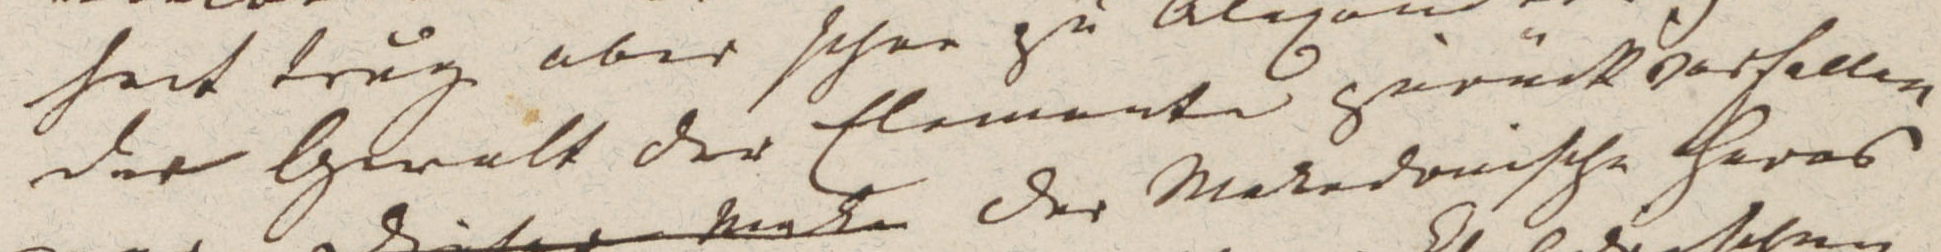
der Gewalt der Elemente zurückverfallen
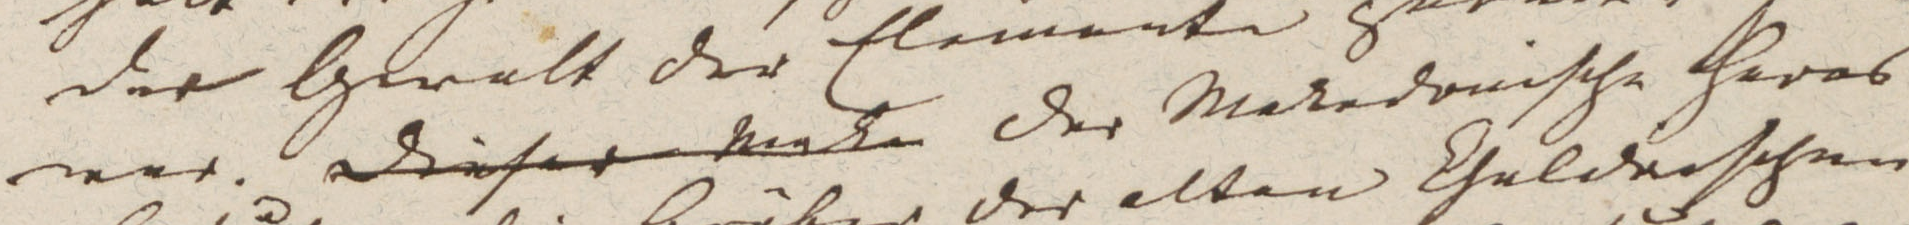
war. Dieser Make Der Makedonische Heros
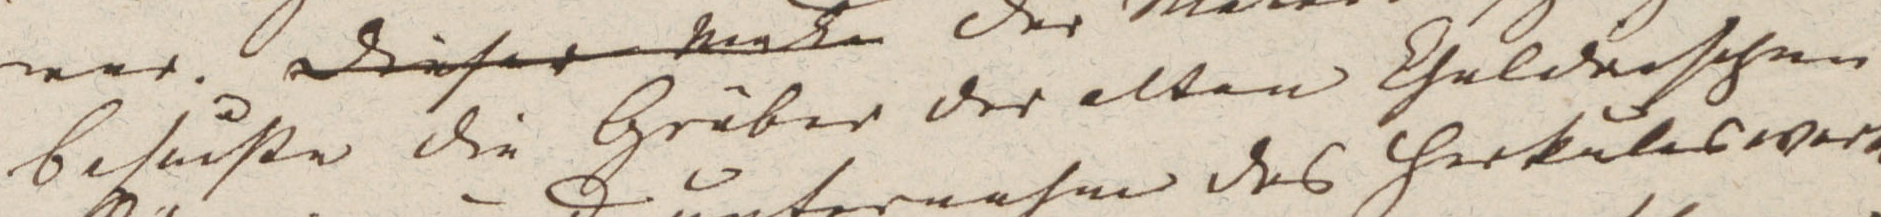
besuchte die Gräber der alten Chaldäischen
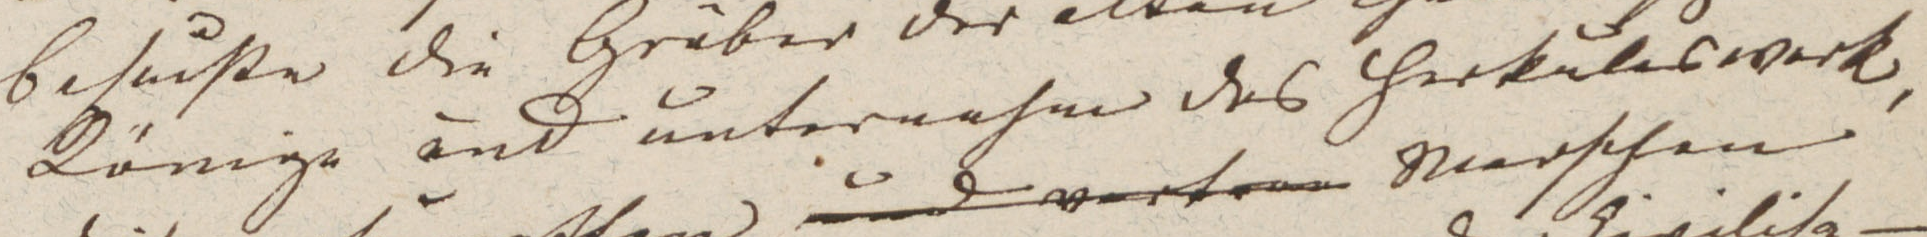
Könige und unternahm das Herkuleswerk,
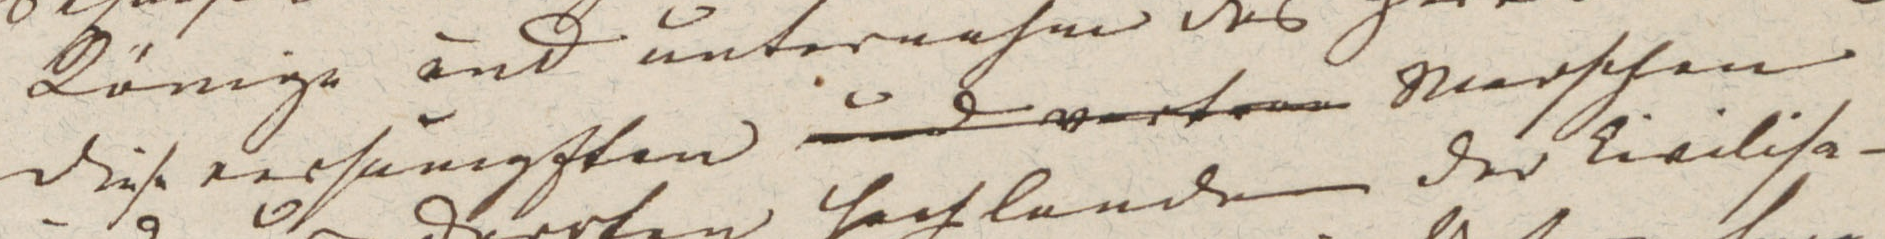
diese versumpften und vert Marschen
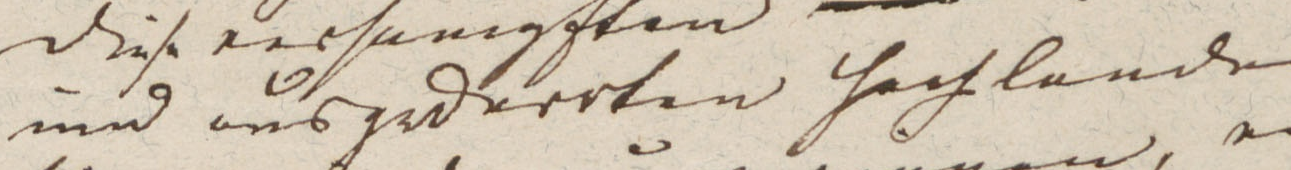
und ausgedrrten Hochlande
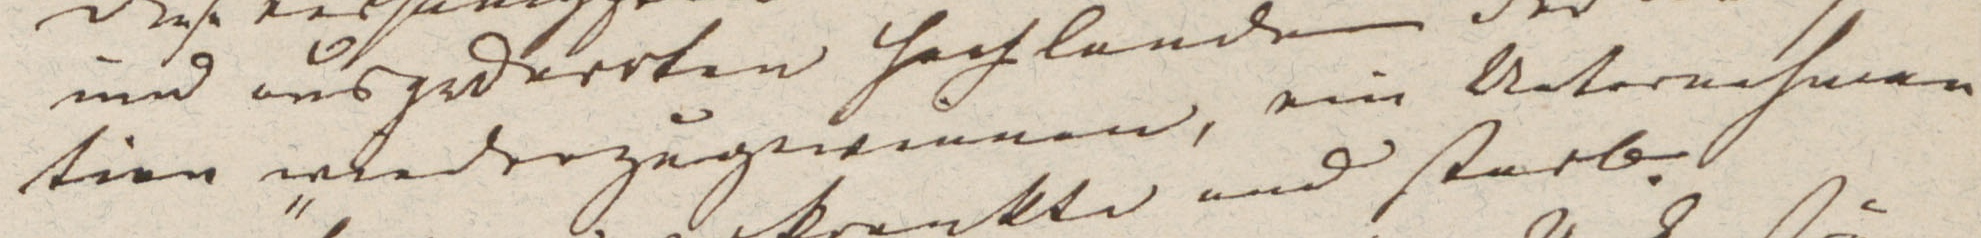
tion wiederzugewinnen, ein Unternehmen
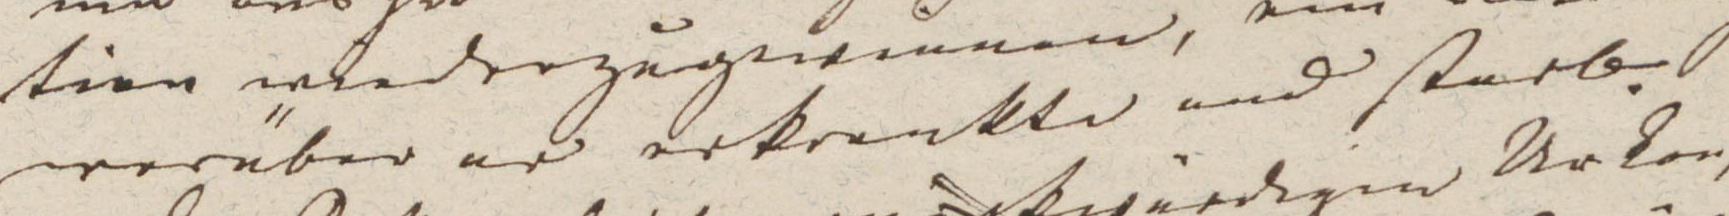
worüber er erkrankte und starb.
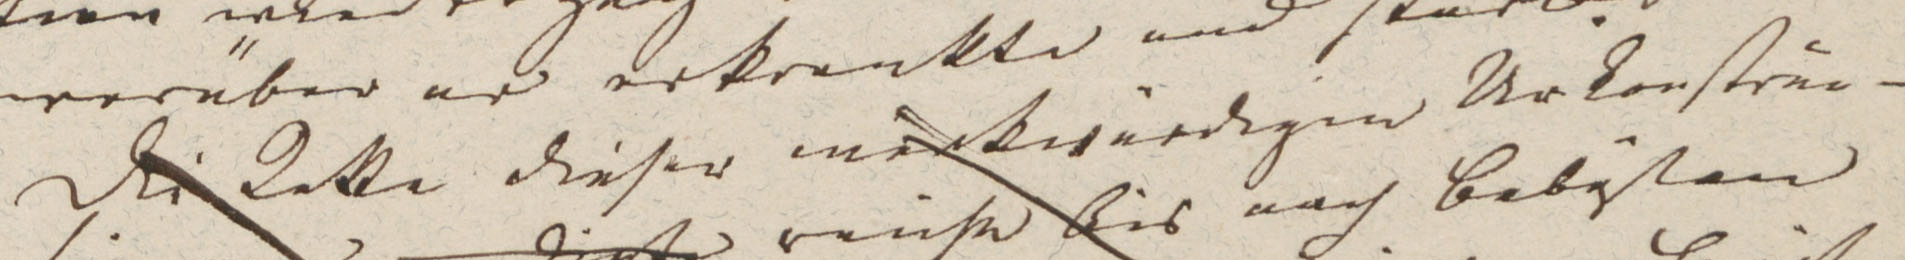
Die Kette dieser merkwürdigen Urkonstruc-
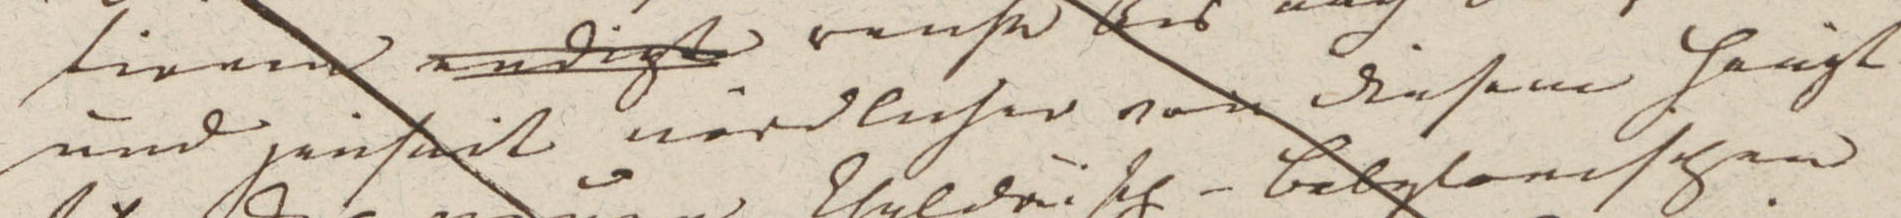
und jenseit nördlicher von diesem Haupt-
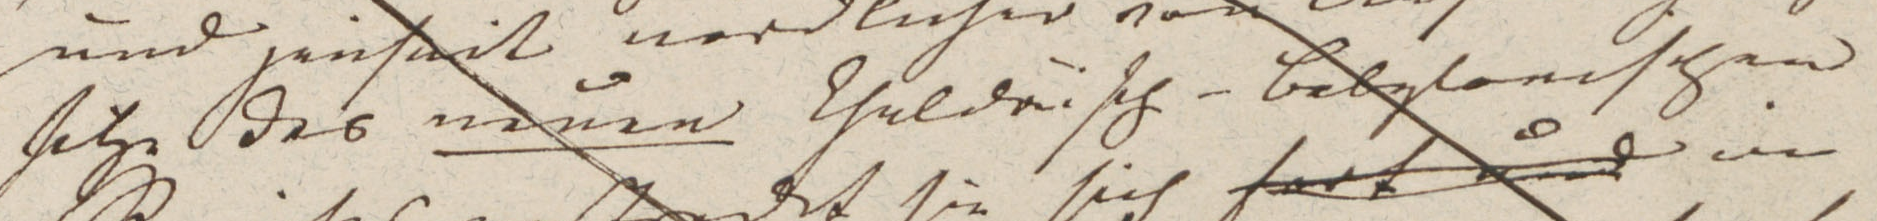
sitze des neuen Chaldäisch-Babylonischen
